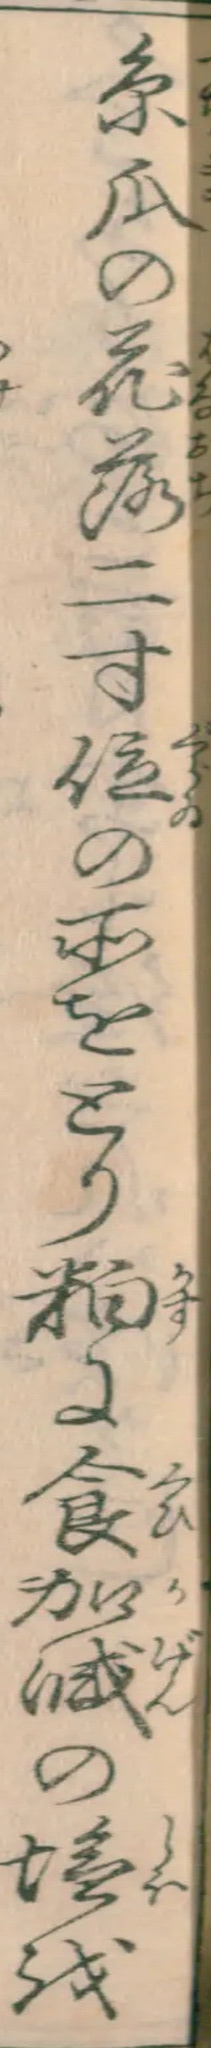糸瓜の花落二寸位の所をとり粕に食加減の塩を
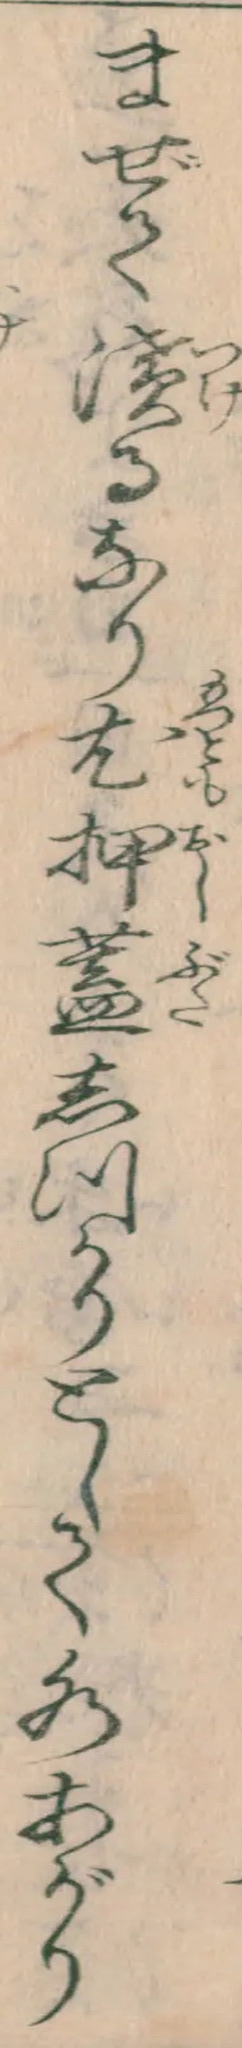まぜて漬るなり尤押蓋しつかりとして水あがり
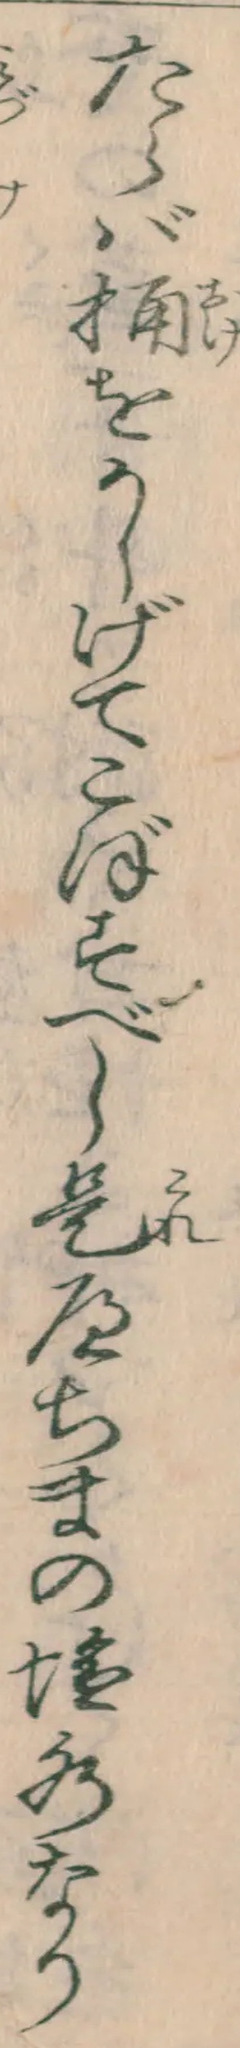たらば桶をかしげてこぼすべし是へちまの塩水なり
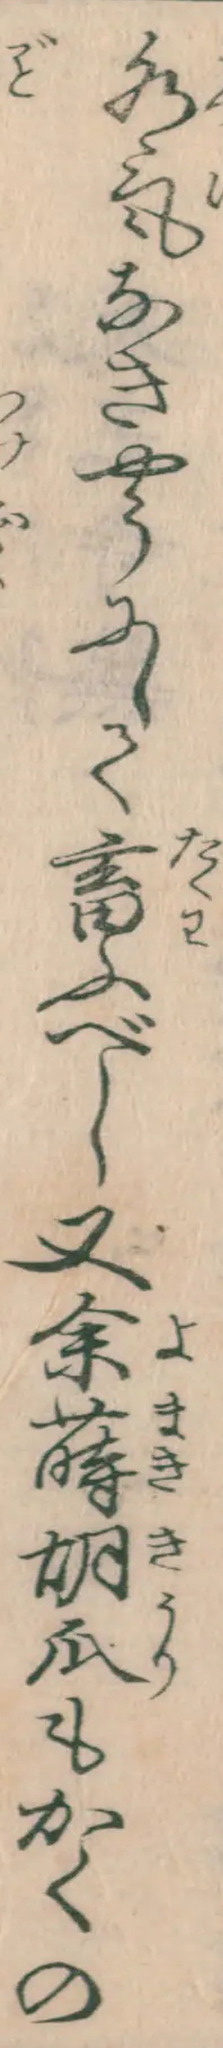水気なきやうにして畜ふべし又余蒔胡瓜もかくの
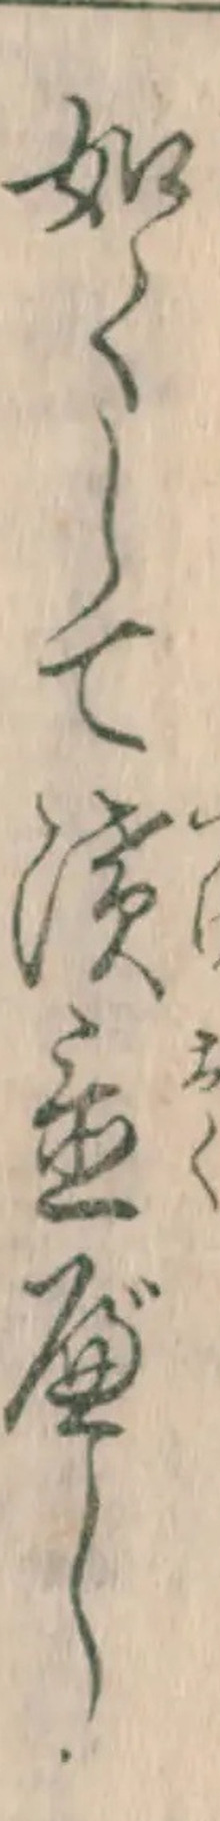如くして漬置べし
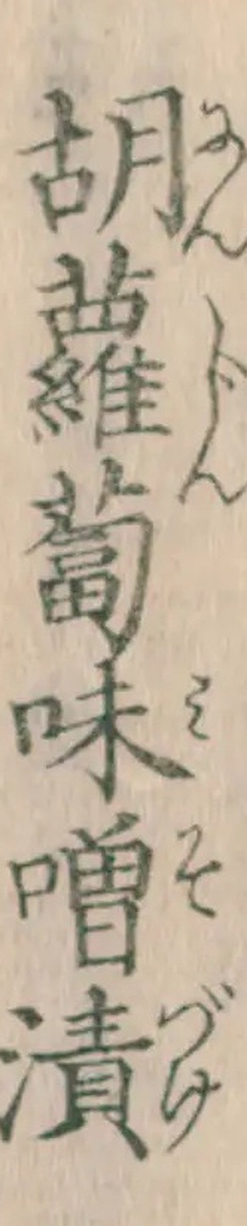胡蘿蔔味噌漬
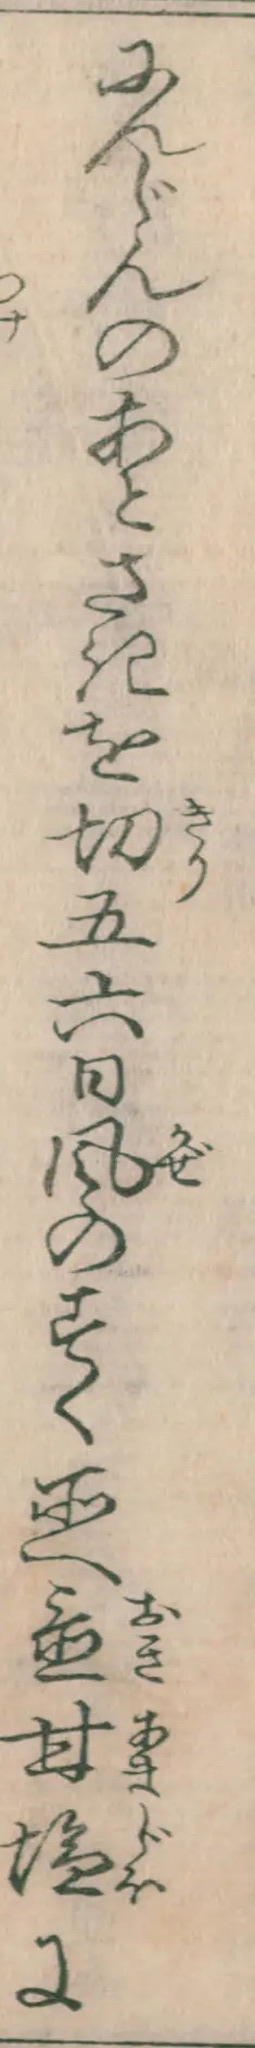にんじんのあとさきを切五六日風のすく所へ置甘塩に
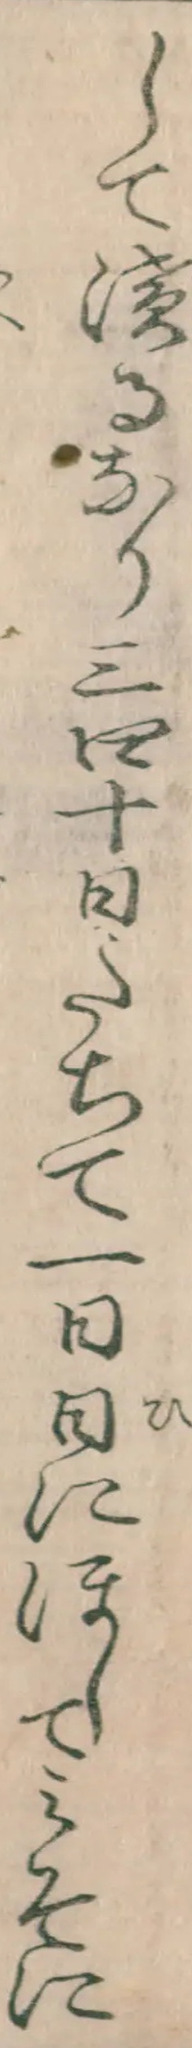して漬るなり三四十日たちて一日日にほしてみそに
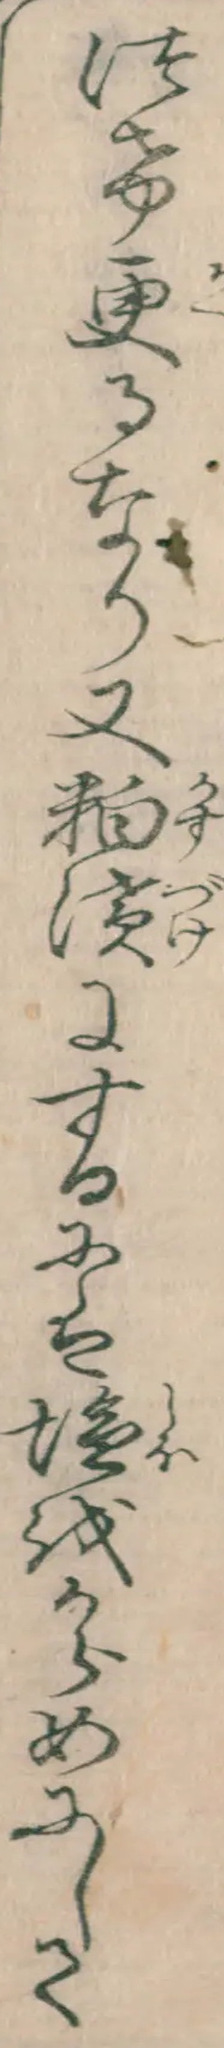つけ更るなり又粕漬にするには塩をからめにして

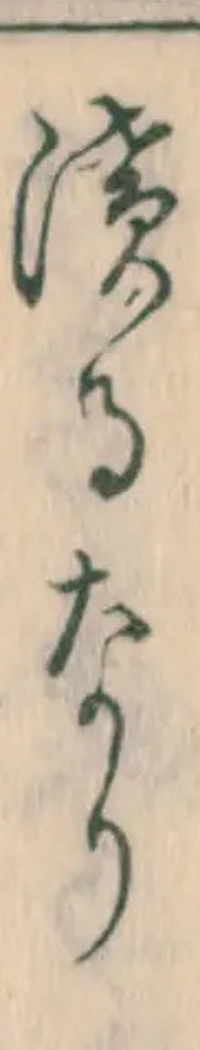漬るなり
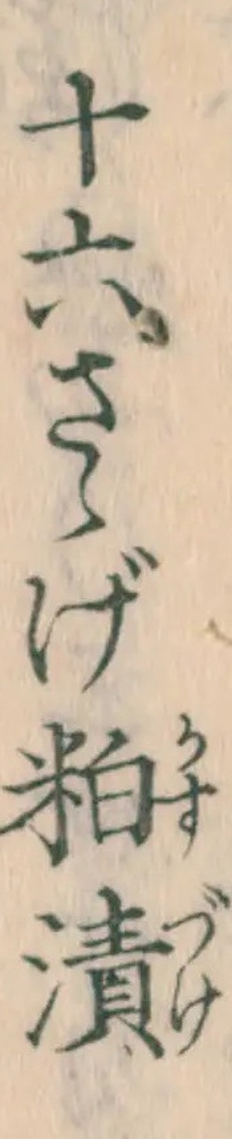十六さゝげ粕漬
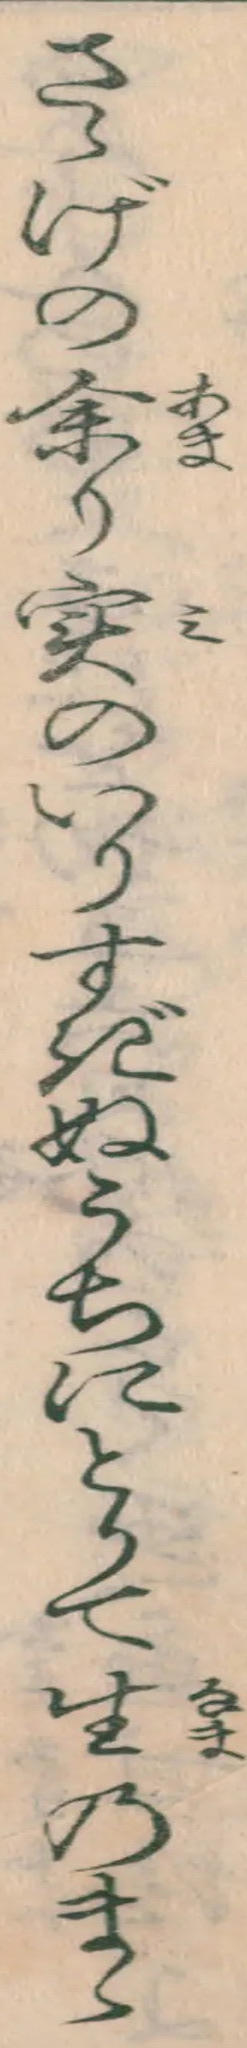さゝげの余り実のいりすぎぬうちにとりて生のまゝ
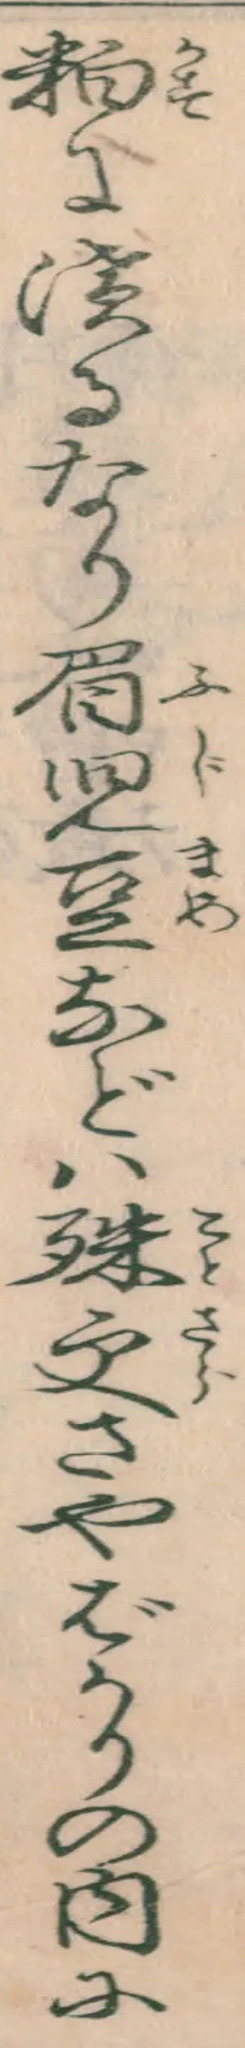粕に漬るなり眉児豆などは殊更さやばかりの内に
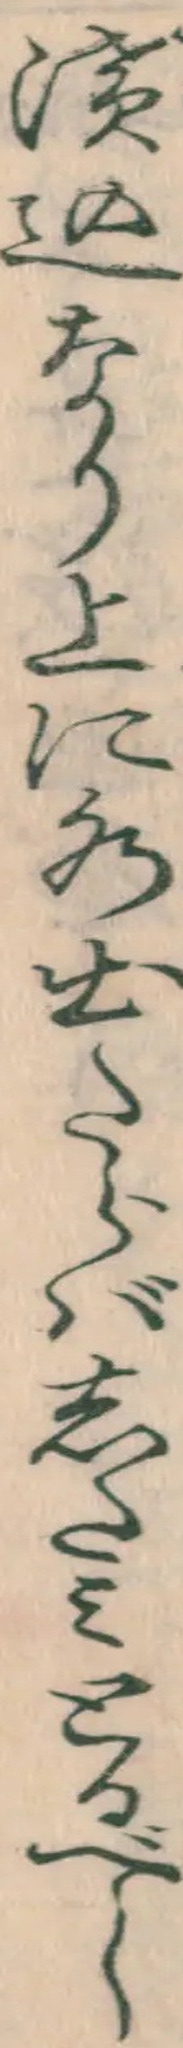漬込なり上に水出たらばしたみとるべし
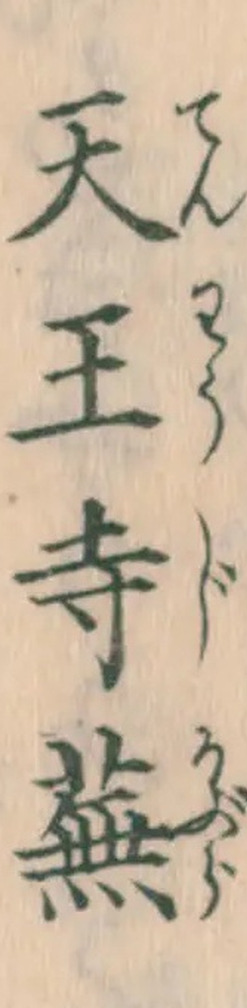天王寺蕪
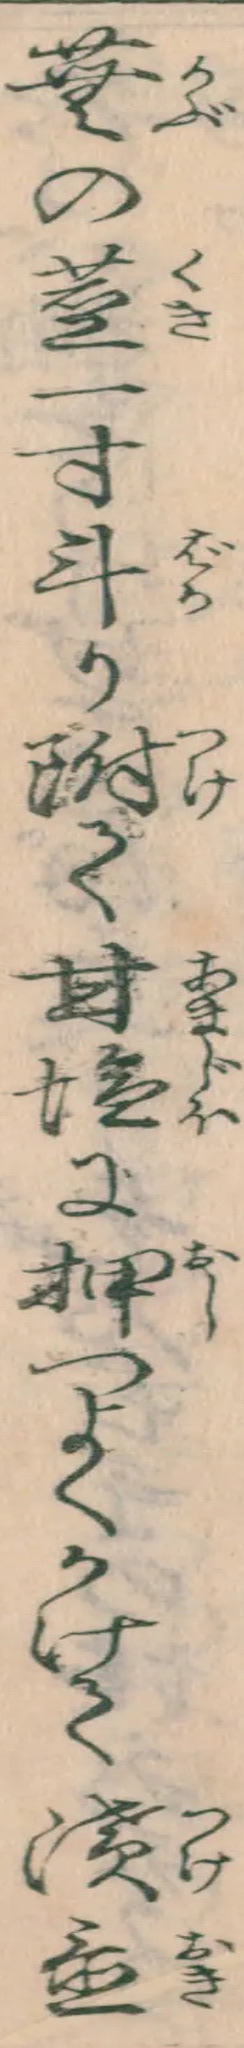蕪の茎一寸斗り附て甘塩に押つよくかけて漬置
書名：四季漬物鹽嘉言
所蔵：国立国会図書館 National Diet Library, JAPAN
